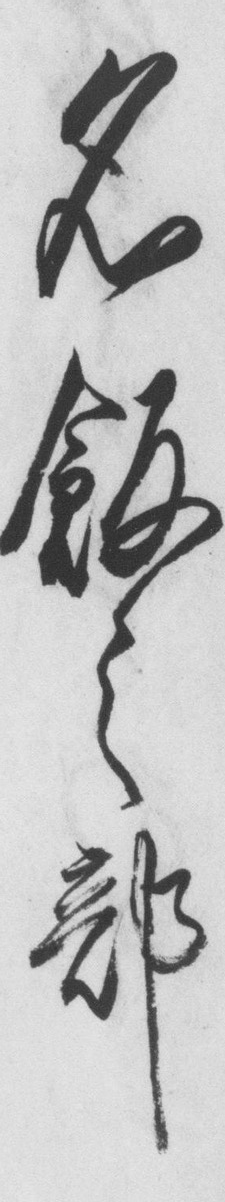名飯の部
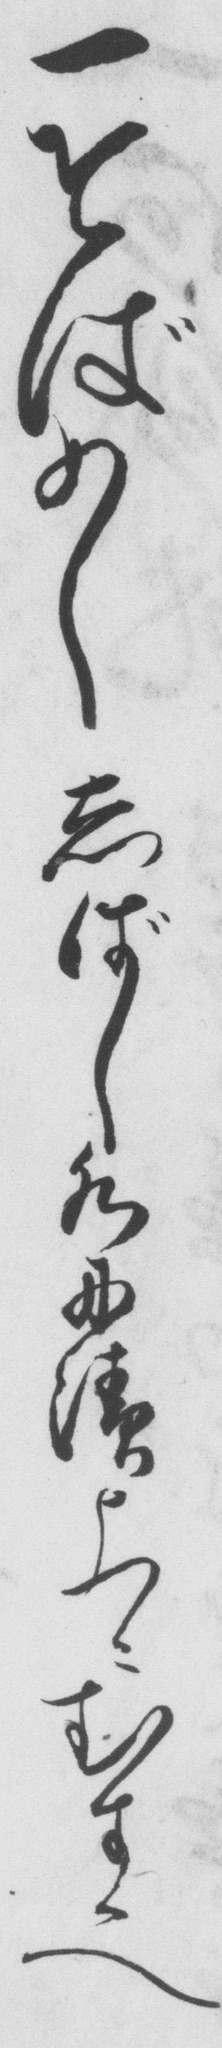一そばめしそばし水に漬上ニむす也
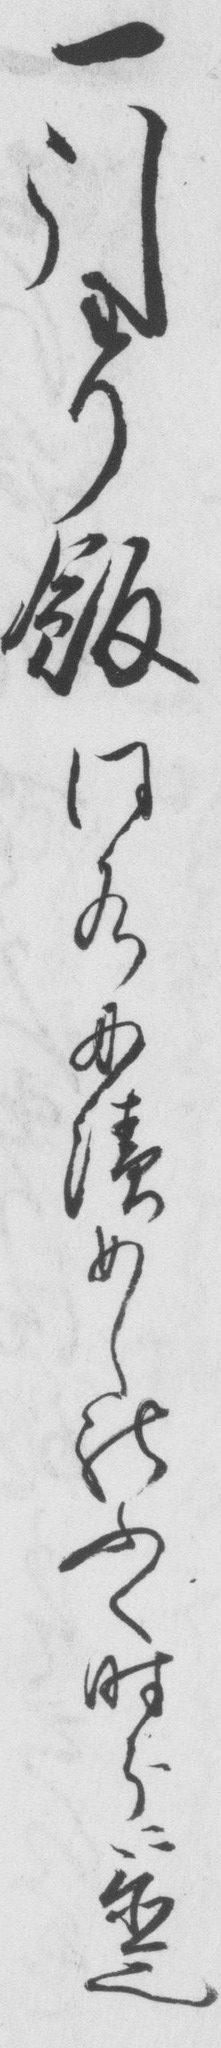一引わり飯同水に漬めしのふく時に置也
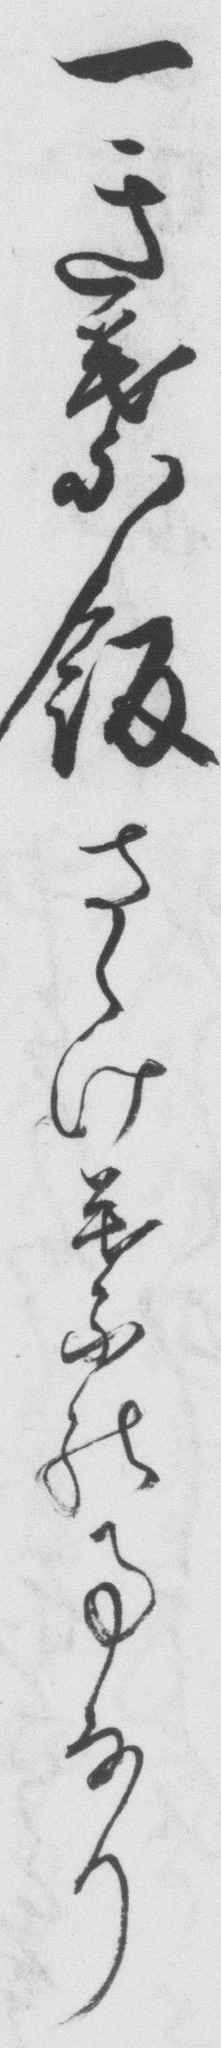一き葉飯さけ葉のるなり
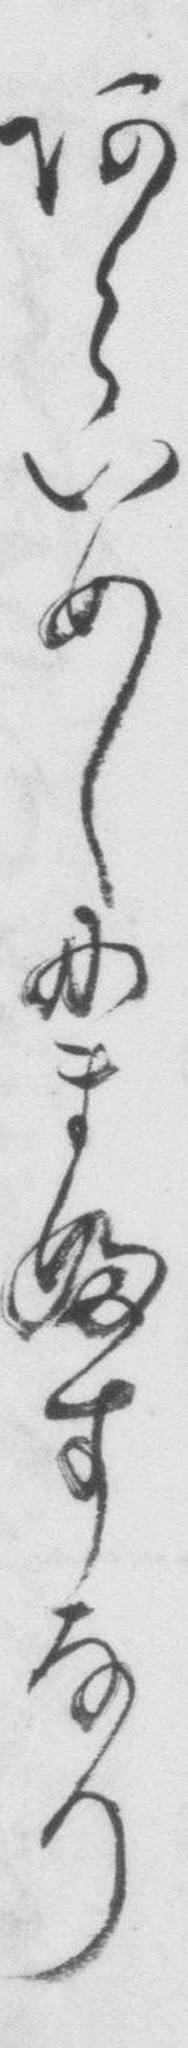あらいめしにまふすなり
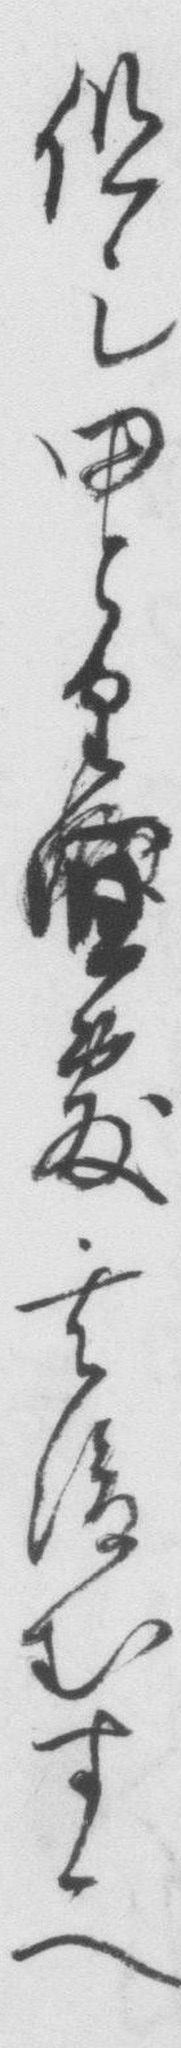但しゆとり敷其後むす也
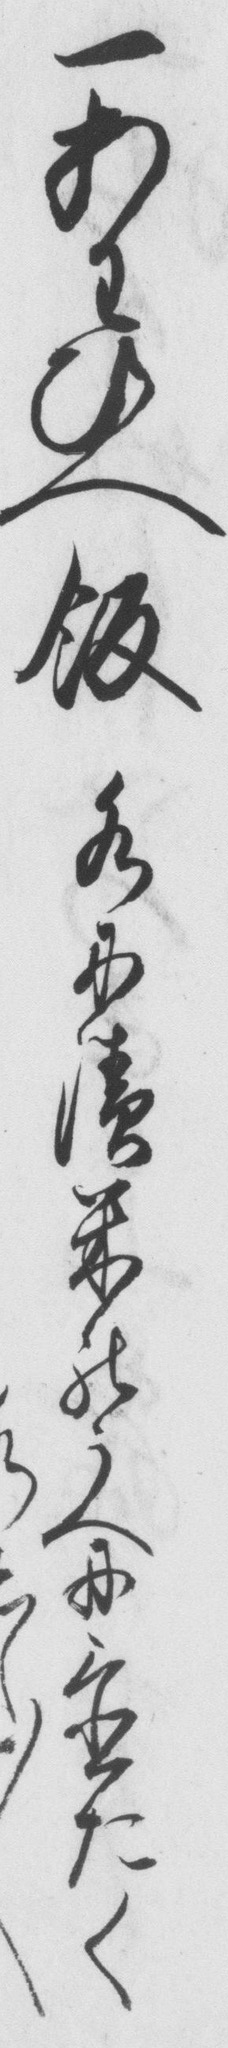一あわひへ飯水に漬米のうへに置たく
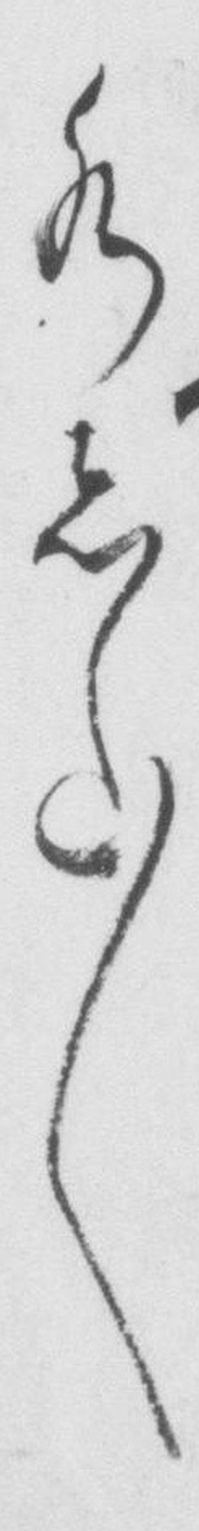水した〳〵

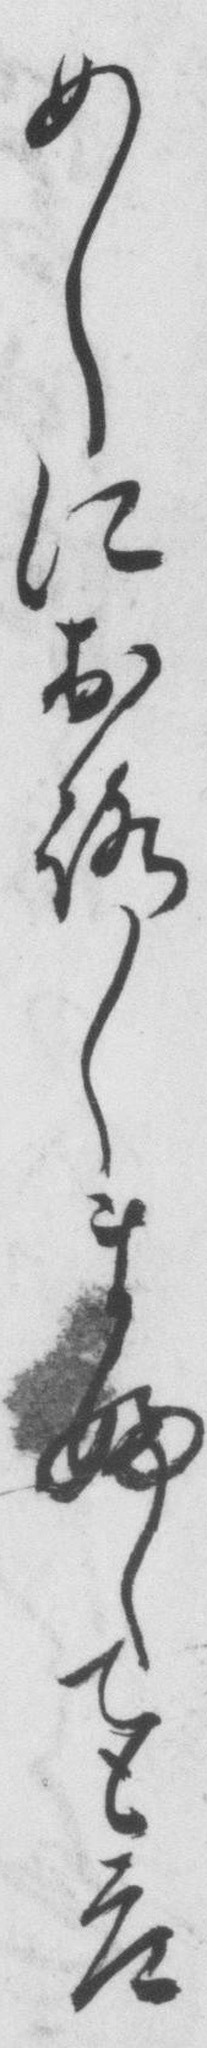めしにおろしまふしても
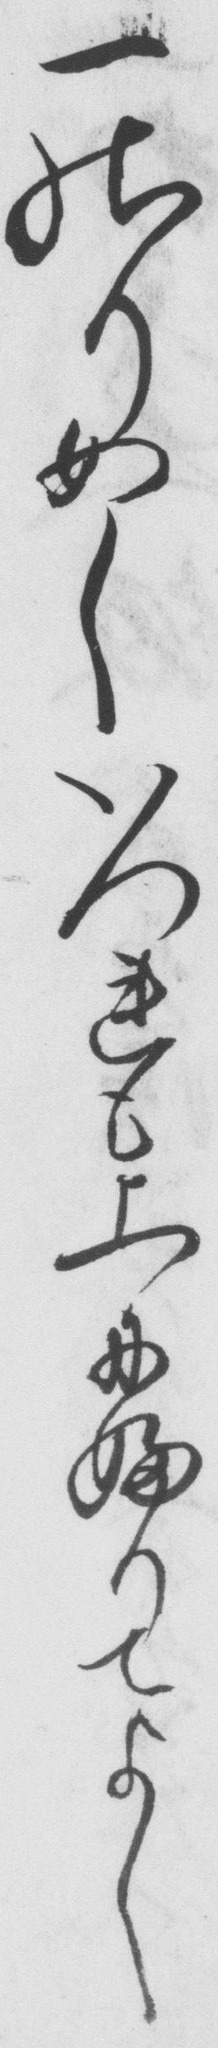一のりめしいつれも上にふりてよし
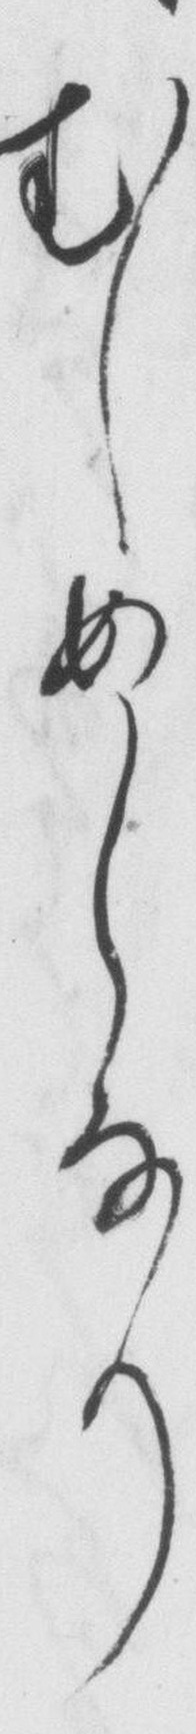むしめしなり
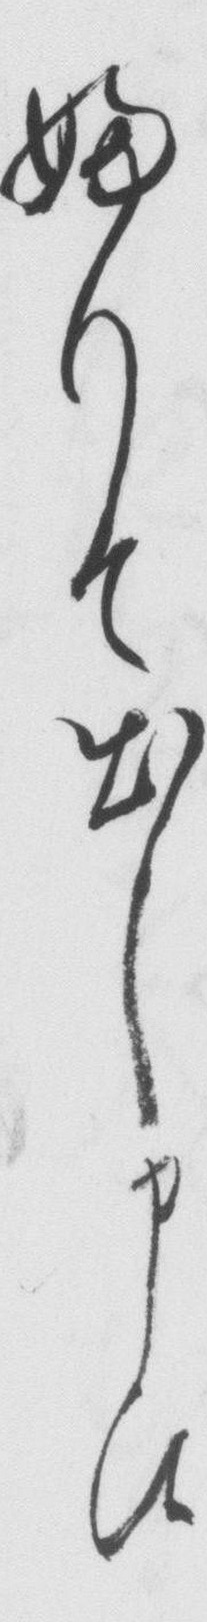ふりて出しひ
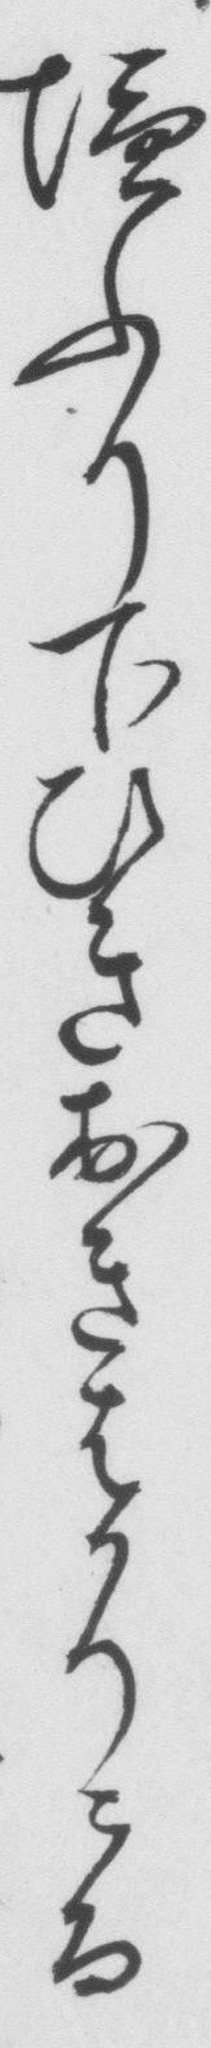塩ふり下ひきおきはかりニる
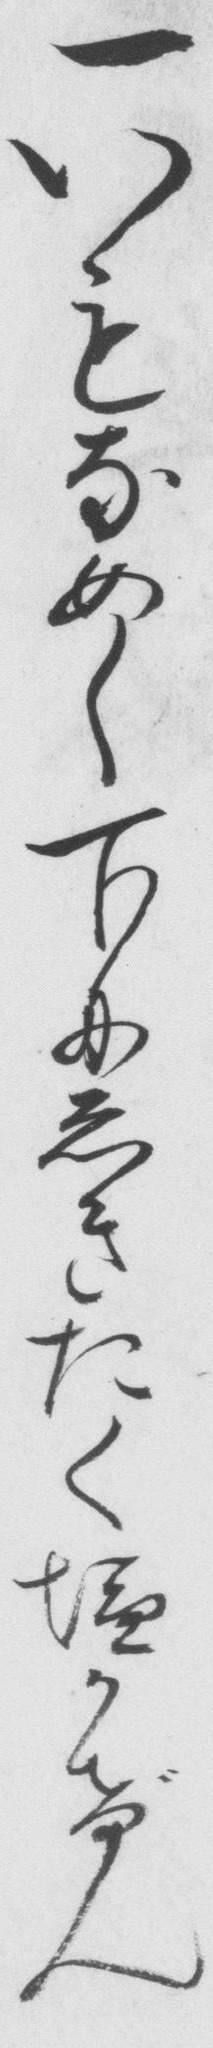一いもなめし下に赤きたく塩かげん
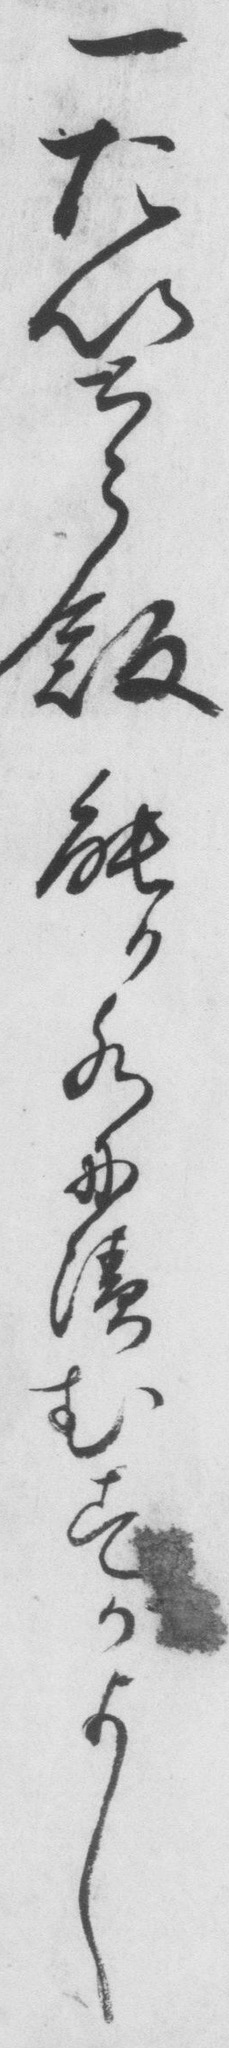一たいちう飯能々水に漬むしかよし
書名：料理筌
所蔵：大阪府立大学学術情報センター 国文学研究資料館
